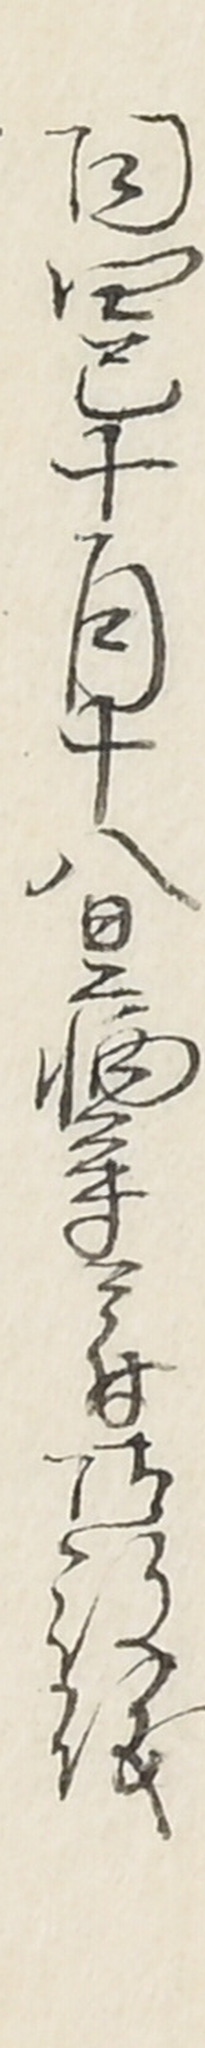一同四巳十月十八日病気ニ付御役儀
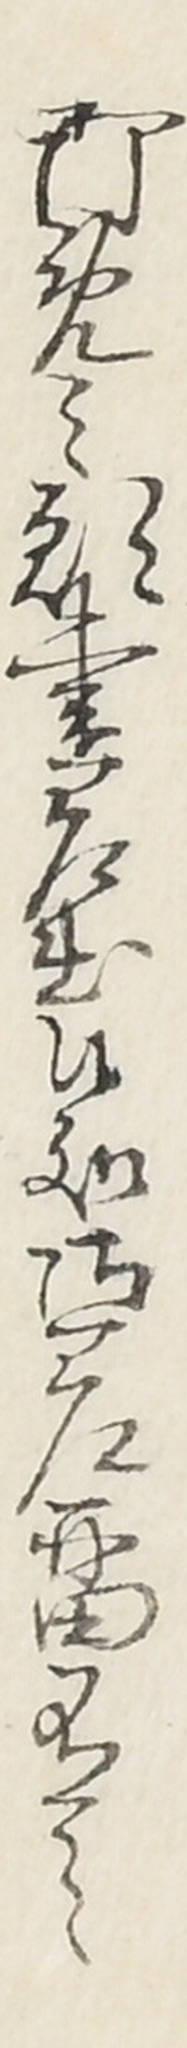御免之願書差出候処御差留有之
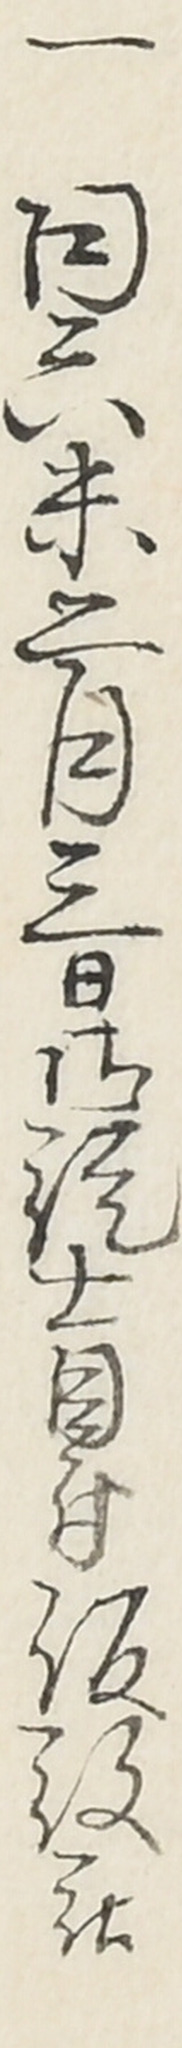一同六未二月三日御徒士目付仮役被
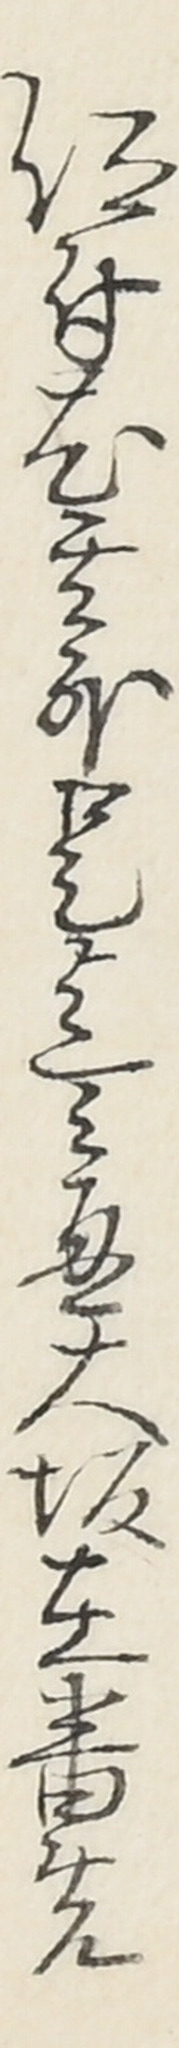仰付尤其外是迄之通大坂在番先
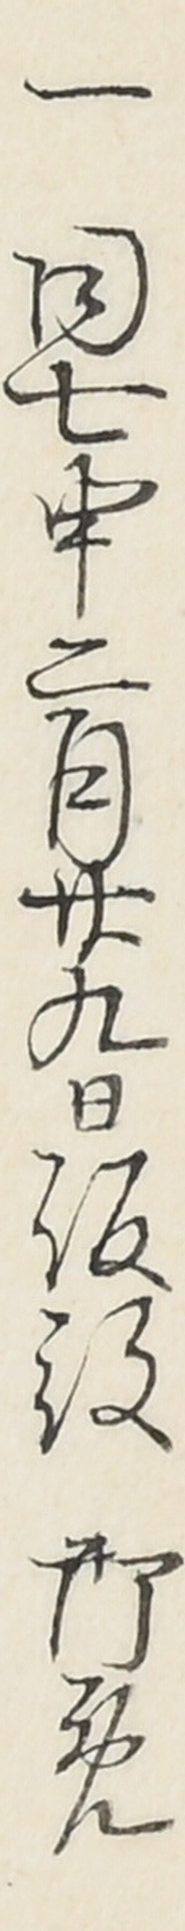一同七申二月廿九日仮役御免
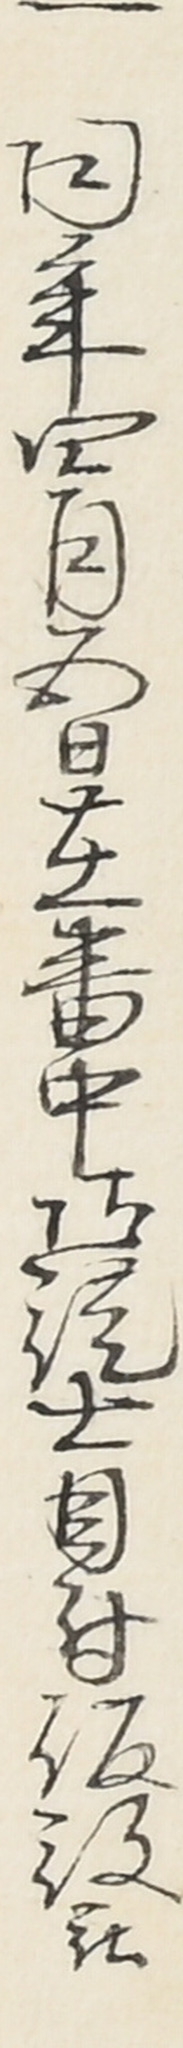一同年四月五日在番中御徒士目付仮役被

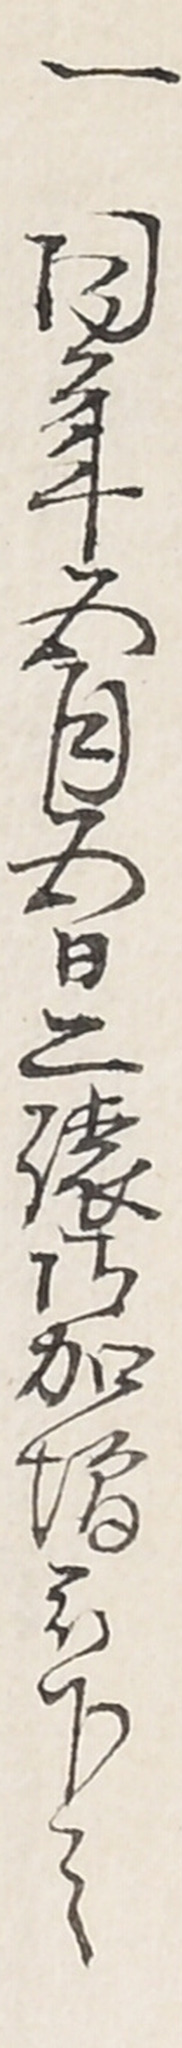一同年五月五日二俵御加増被下之
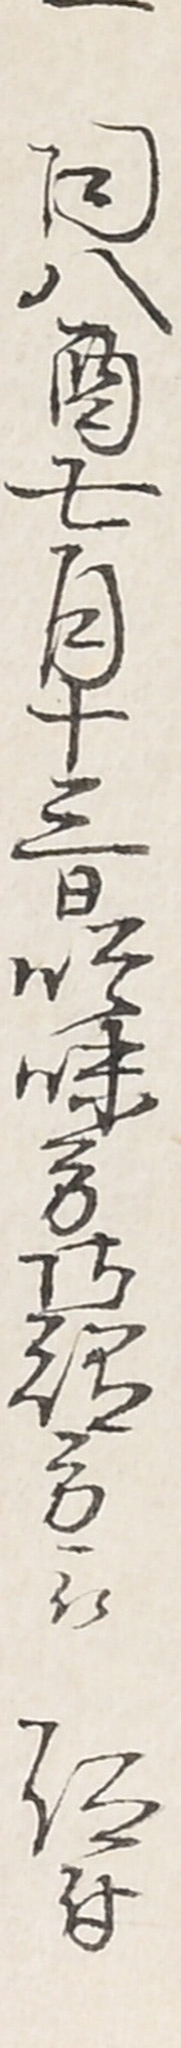一同八酉七月十三日吟味方御賄方被仰付
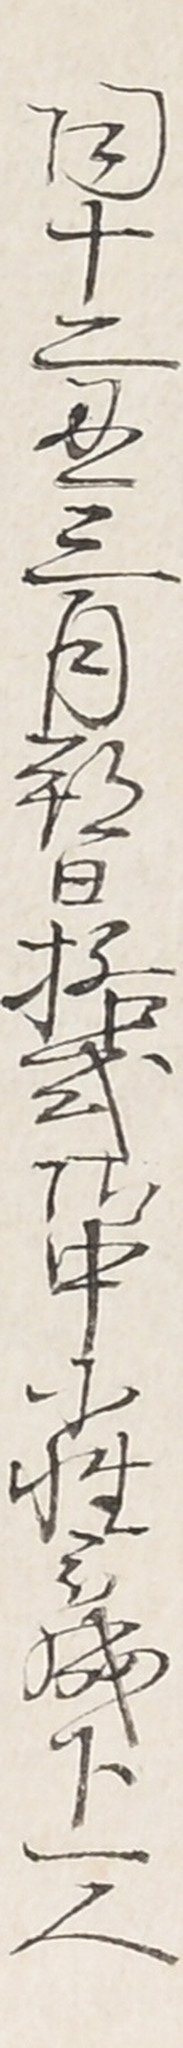一同十二丑三月朔日格式御中小性被成下一人
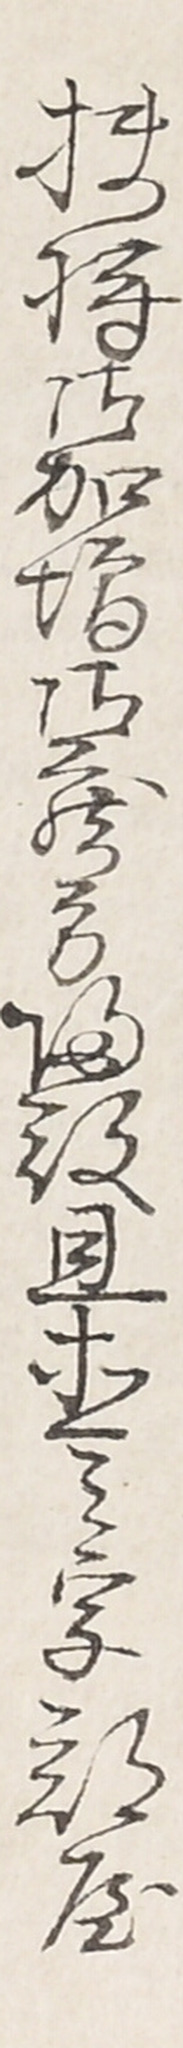扶持御加増御蔵方帰役且直之字部屋
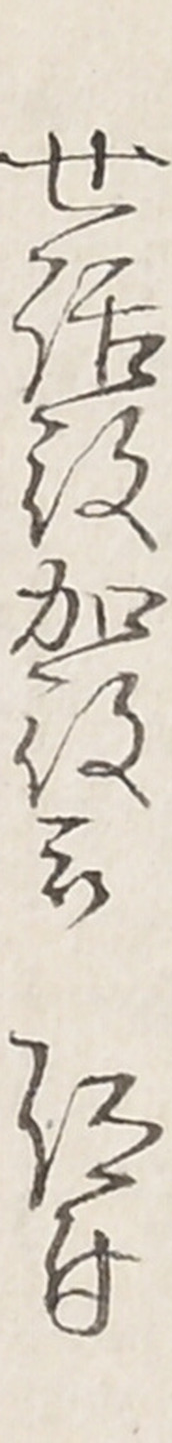世話役加役被仰付
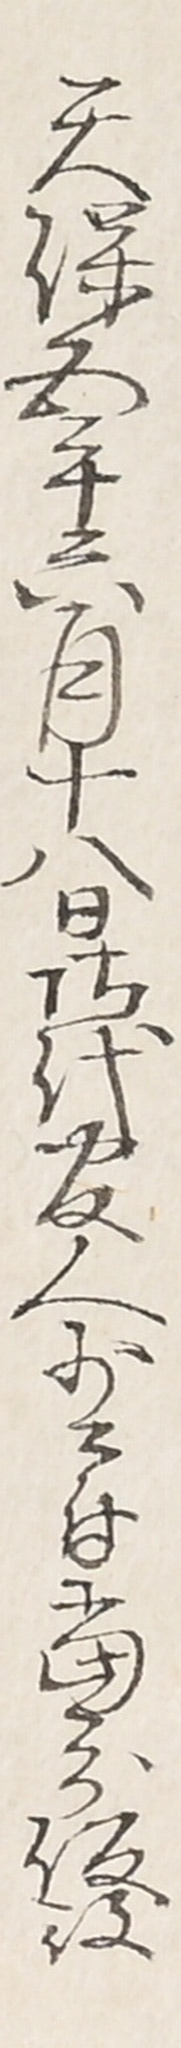一天保五午六月十八日御代官人少ニ付当分仮役
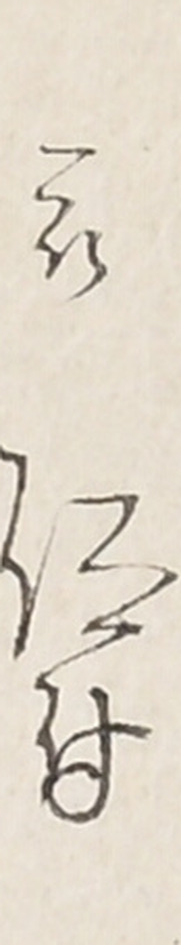被仰付
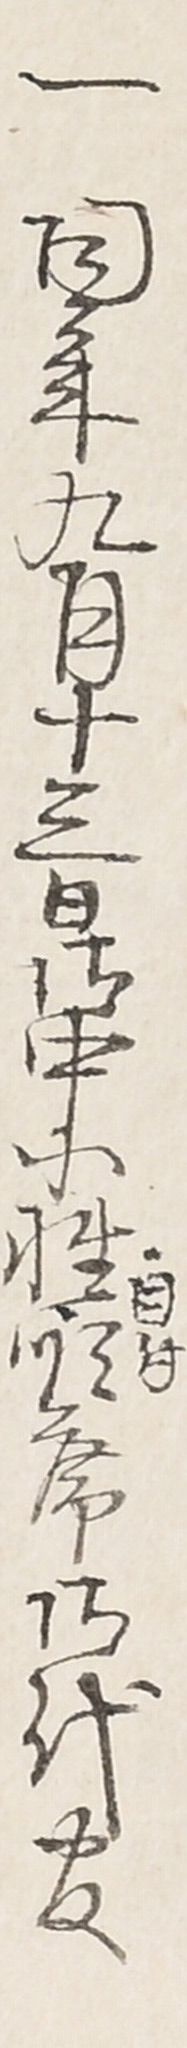一同年九月十三日御中小性・順席御代官
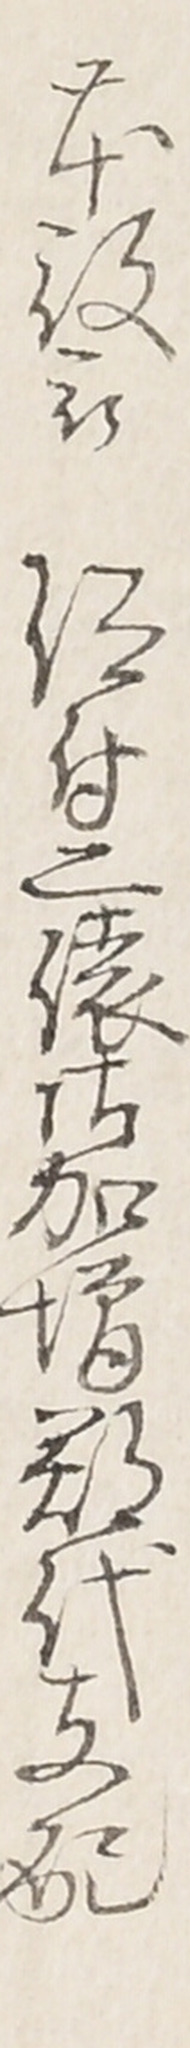本役被仰付二俵御加増郡代支配
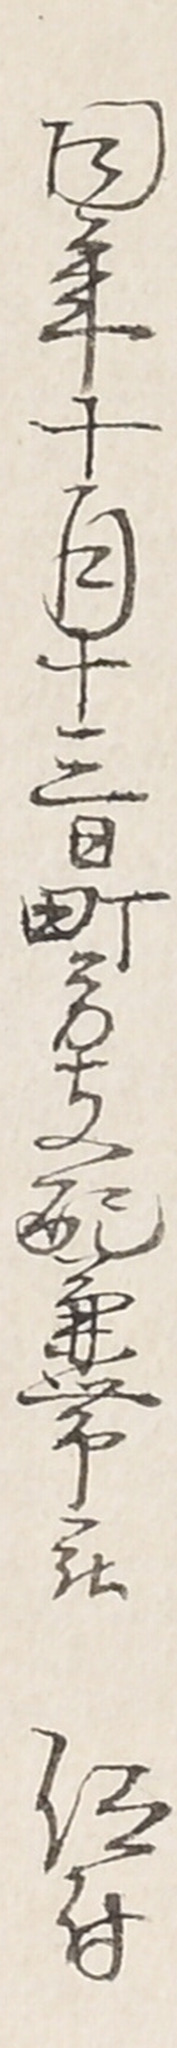一同年十月十三日町方支配兼帯被仰付
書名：無足諸士勤仕録（四）
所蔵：伊那市立高遠町図書館・合同会社AMANE
